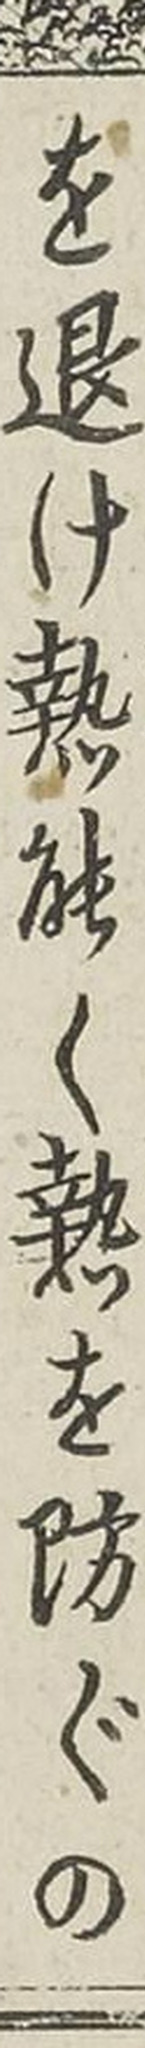芦を退け熱能く熱を防ぐの
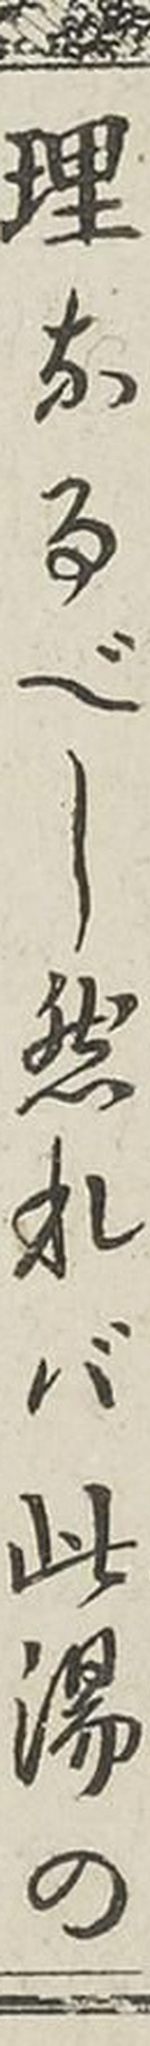の理なるべし然れば此湯の
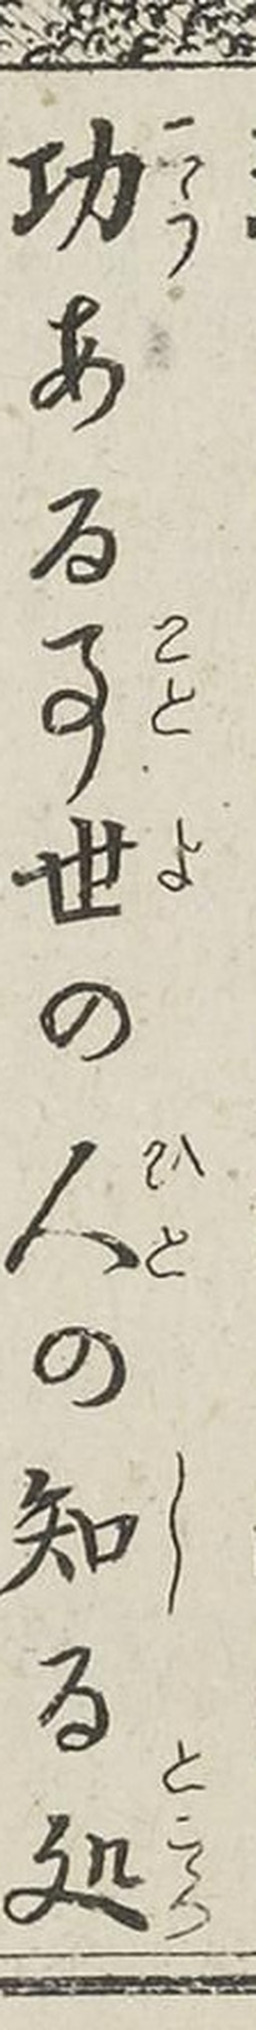湯功ある事世の人の知る処
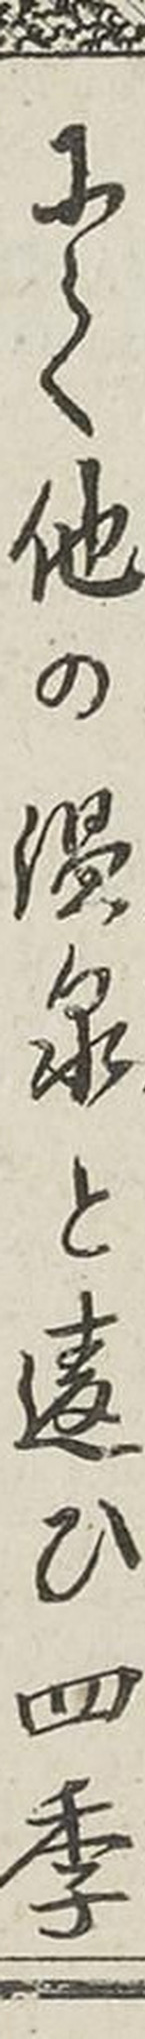之にて他の温泉と違ひ四季
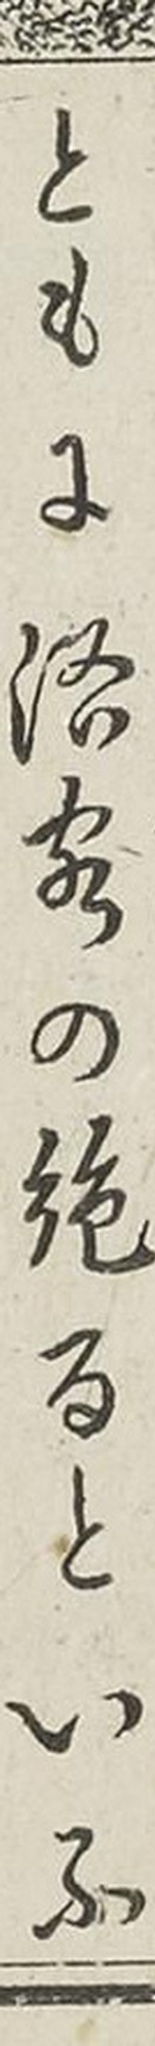圖ともに浴客の絶るといふ
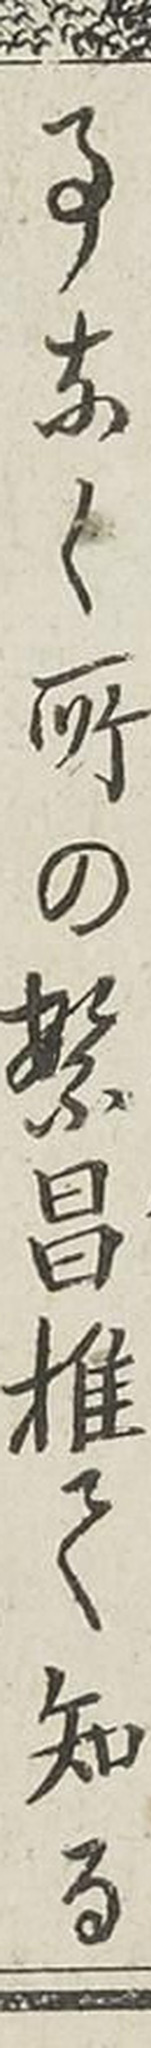事なく所の繁昌推て知る
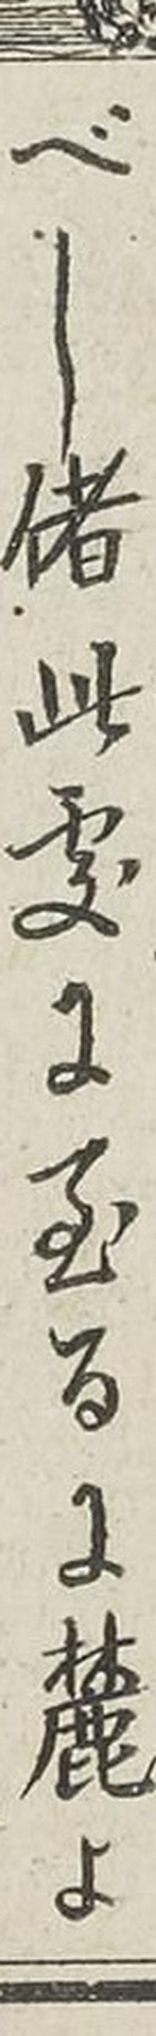べし偖此處に至るに麓よ
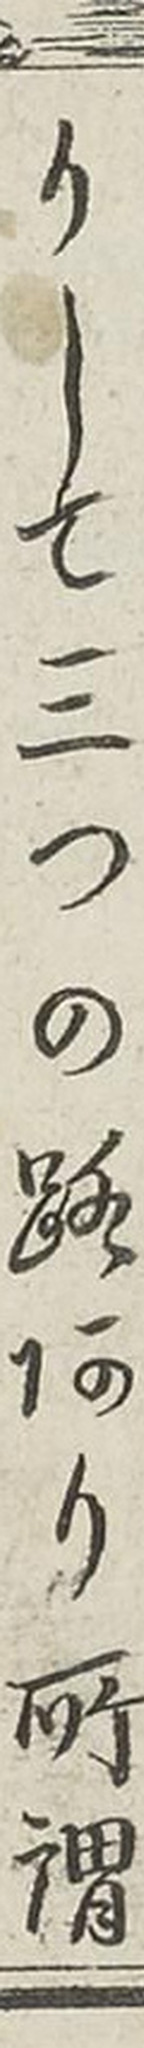りして三つの路あり所謂
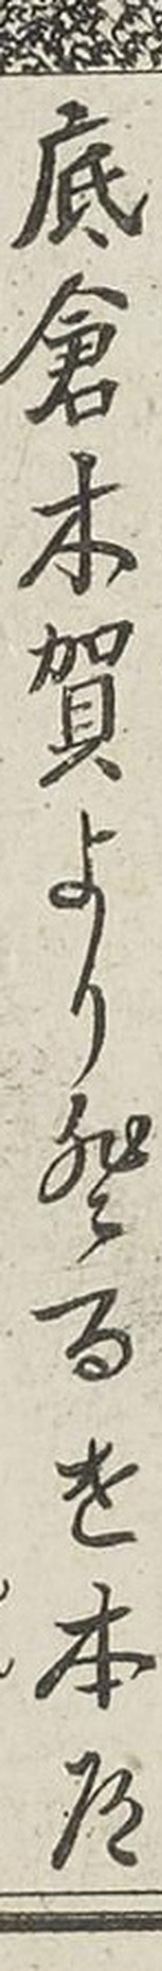底倉木賀より登るを本道
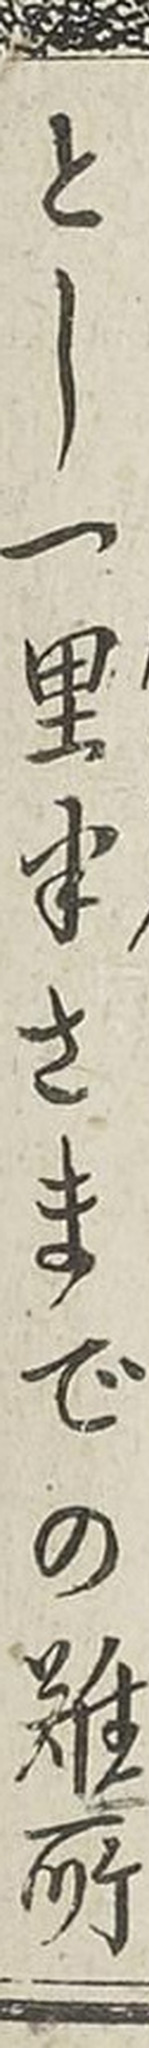とし一里半さまでの難所
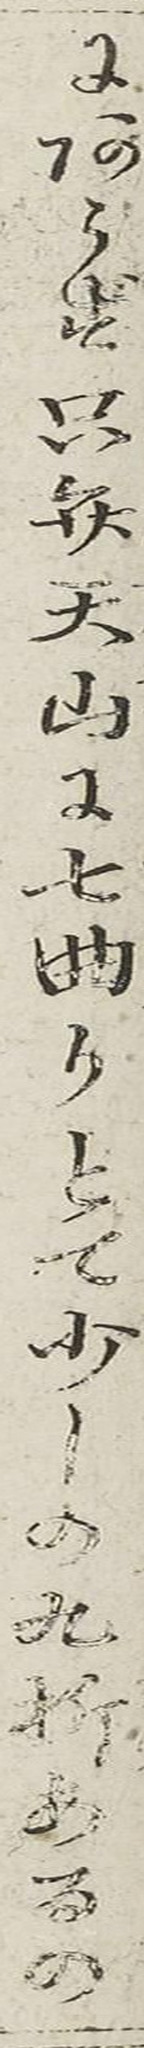にあらず只弁天山に七曲りとて少しの九折あるの
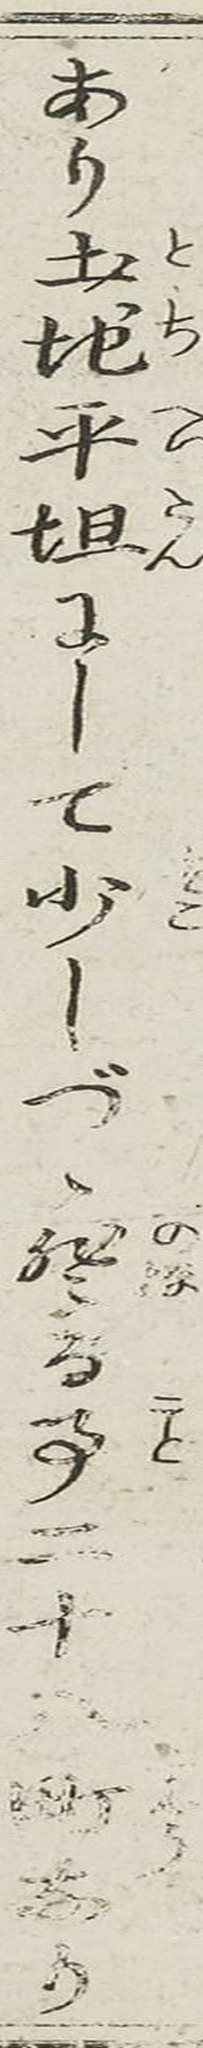あり土地平坦にして少しづゝ登る事二十八町なり
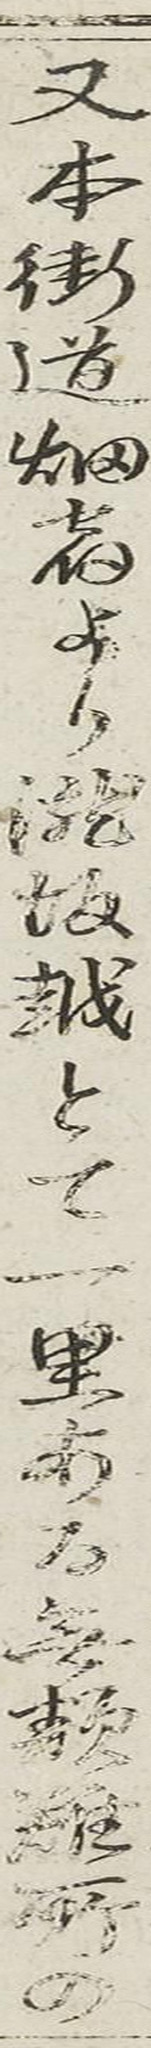又本街道畑宿より瀧坂越とて一里ある無類難所の
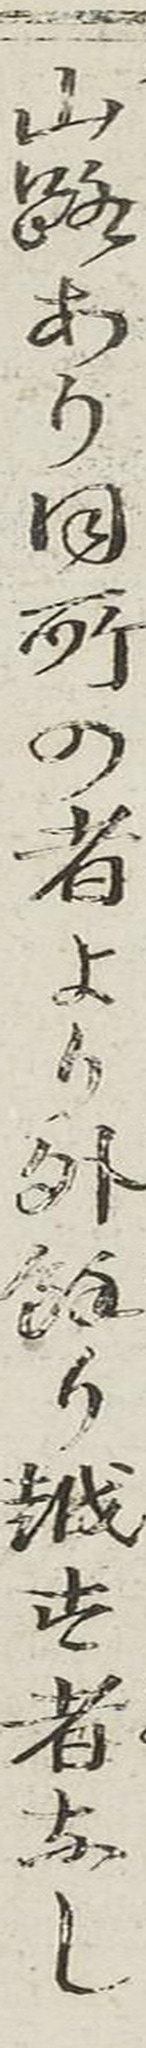山路あり同所の者より外餘り越す者なし
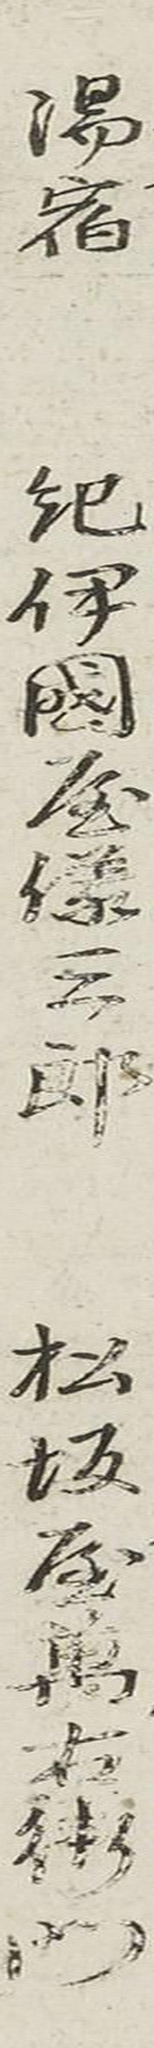湯宿紀伊國屋儀三郎松坂屋萬右衛門
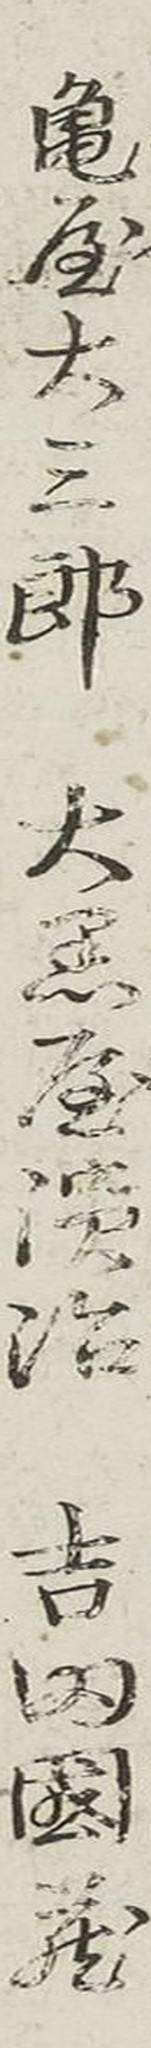亀屋大三郎大黒屋浜治吉田國蔵
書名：箱根温泉誌　全
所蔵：東京大学地震研究所図書室 Earthquake Research Institute Library, The University of Tokyo, JAPAN
